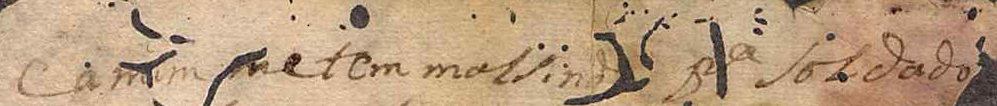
E a mim me tem mal send_ pa soldado
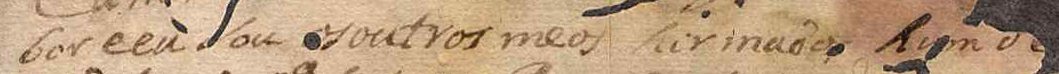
bor e eu sou os outros meos hirmaõos hum o e
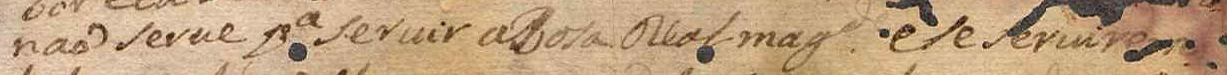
naõ serue p.a seruir a Vosa Real mag.de e se seruirem
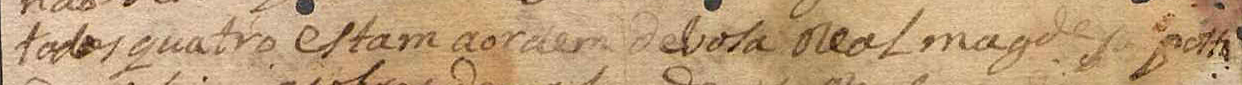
todos quatro estam a ordem de vosa ReaL magd.e su_peito
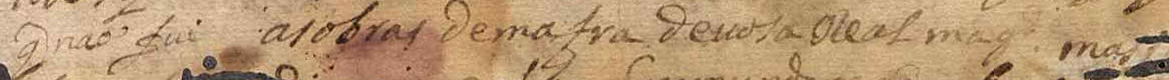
q̄ naõ fui as obras de mafra de uosa Real mag.de mas
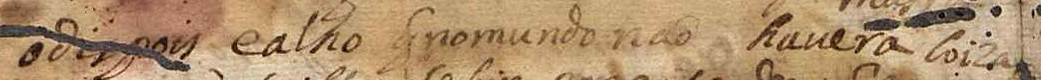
o dispois e acho q̄ no mundo naõ hauera coiza
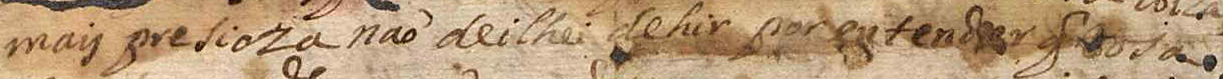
mais presioza naõ deiChei de hir por entender q̄ vosa
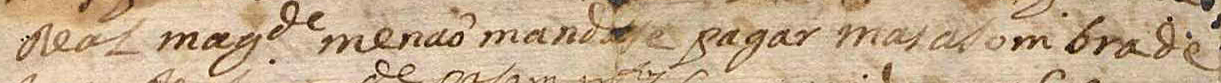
ReaL mag.de me naõ mandase pagar mas a sombra de
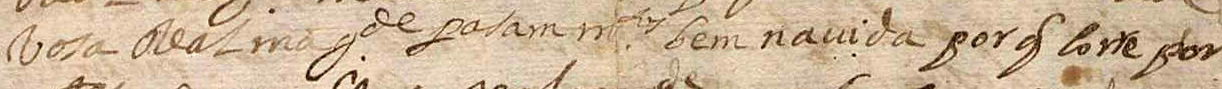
vosa ReaL mag.de pasam m.tos bem na uida porq̄ corre por
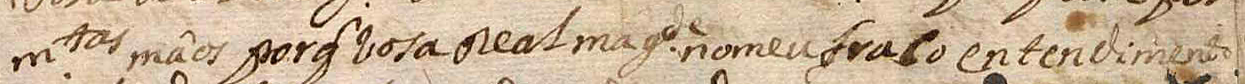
m.tas mãos porq̄ vosa Real mag.de no meu fraCo entendimento
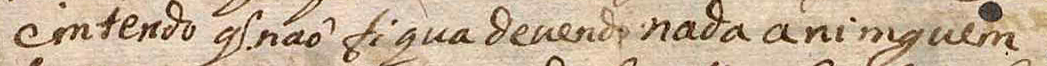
emtendo q̄. naõ fiqua deuendo nada a nimguem
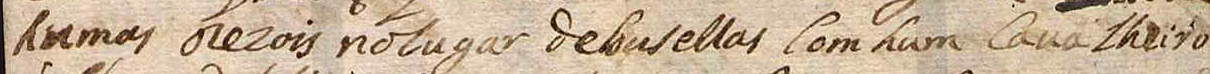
humas Rezois no lugar de busellas Com hum Caualheiro
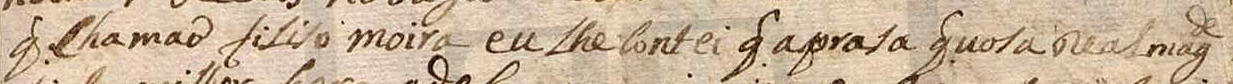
q̄. Chamaõ filiso moira eu lhe Contei q̄ a prasa q̄ uosa Real mag.de
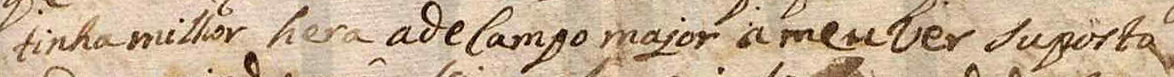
tinha milhor hera a de Campo major a meu ver suposto
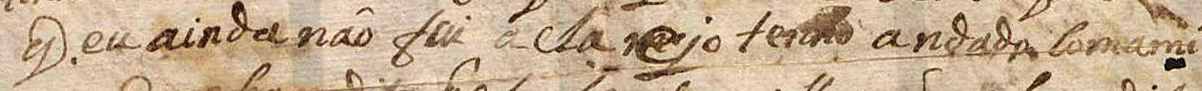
q̄. eu ainda naõ fui a ela e jo tendo andado Com ami
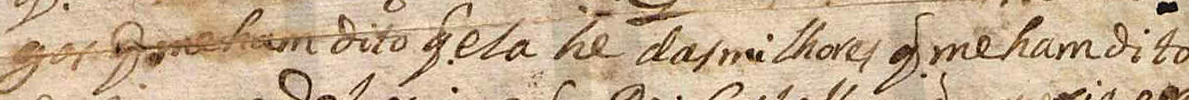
gos q̄ me ham dito q̄. ela he das milhores q̄ me ham dito
